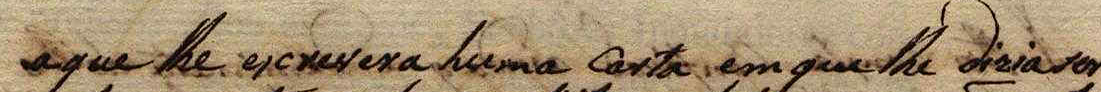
o que lhe escrevera huma carta em que lhe dizia ser
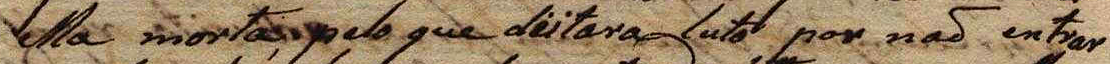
ella morta, pelo que deitara luto por naõ entrar
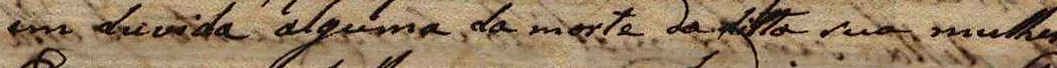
em duvida alguma da morte da ditta sua mulher
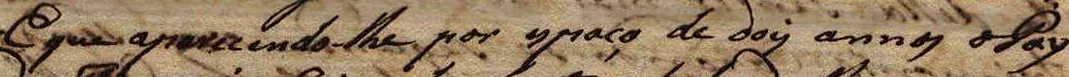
E que aparecendo-lhe por espaço de dois annos o Pay
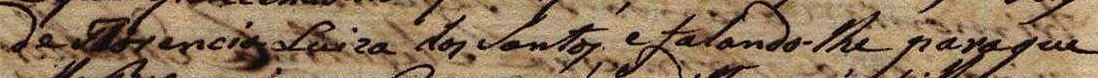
de Florencia Luiza dos Santos, e falando-lhe para que
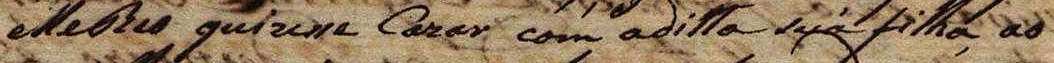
elle Reo quizesse Cazar com a ditta suá filha, ao
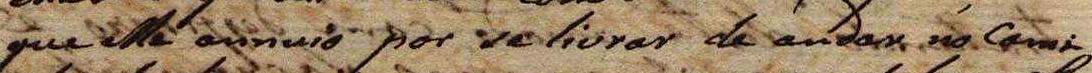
que elle annuio por se livrar de andar no Cami
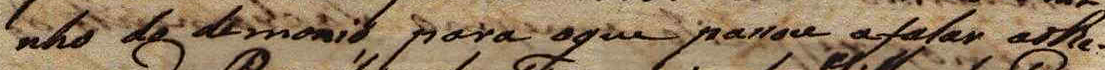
nho do demonio, para o que passou a falar ao Re
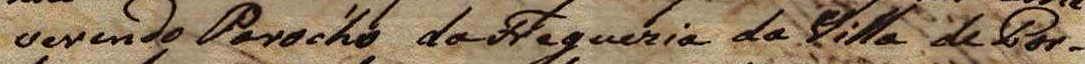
verendo Parocho da Freguezia da Villa de Por
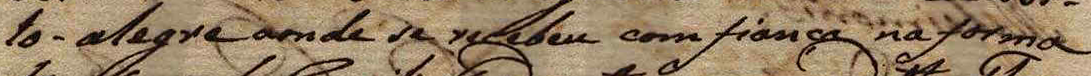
to alegre aonde se recebeu com fiança na forma
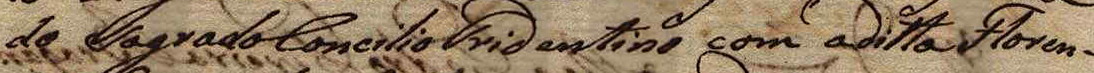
do sagrado Concilio Tridentino com a ditta Floren
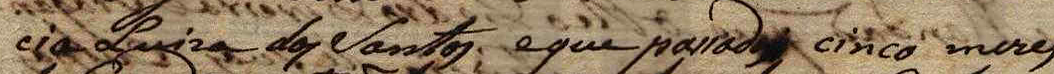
cia Luiza dos Santos; e que passad_ cinco mezes
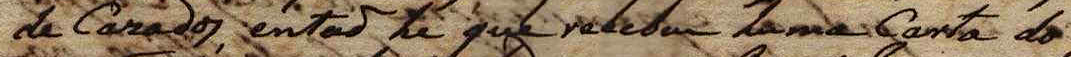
de Cazados, entaõ he que recebeu huma Carta do
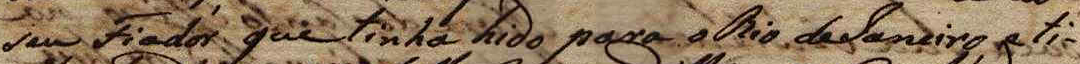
seu Fiador, que tinha hido para o Rio de Ianeiro, e ti
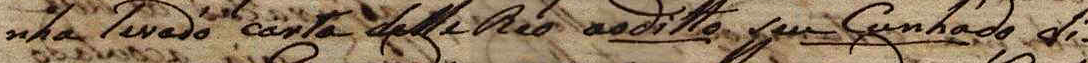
nha levado carta delle Reo ao ditto seu Cunhado, di
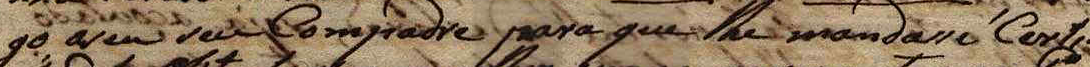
go, a seu seu Compadre para que lhe mandasse Certi
